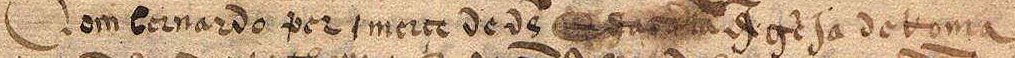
Dom bernardo per / merçe de ds̄ e da sāta JgreJa de Roma
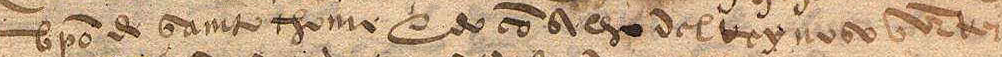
bp̄o de samto thome e do c̄oselho del Rey noso sōr Rei
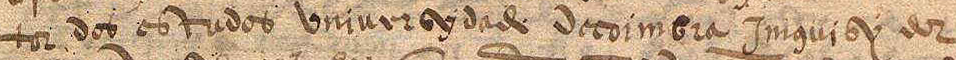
tor dos estudos vniuersydade de coimbra Jmqujsydor
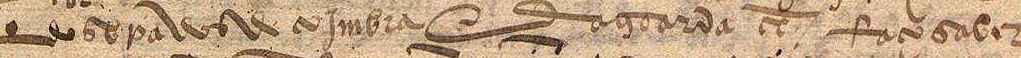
dos bpādos de coJmbra e da goarda c̄c/ faço saber
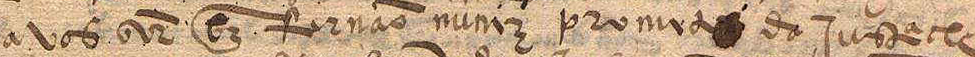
a vos sōr b̄z fernão nunez prometor da Justa cle
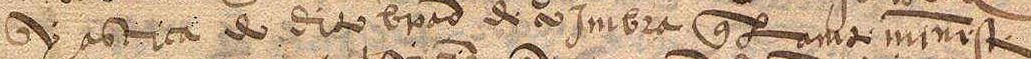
syastica do dito bpāo de coJmbra q̄ ꝑamte m̄i neste
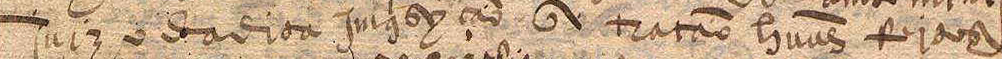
Juizo da dita Jmqisyção se tratão huūs fejtos
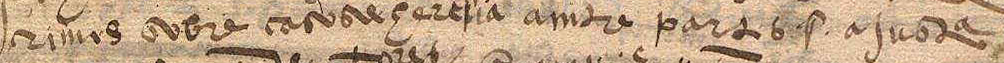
crimes sobre casos de heresia amtre partes .s. a Justa
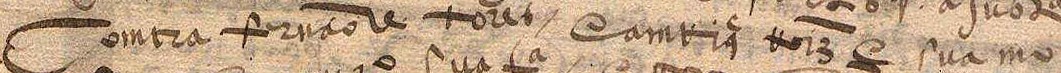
Comtra fernão de tores / e amRiqe Rōiz e sua mo
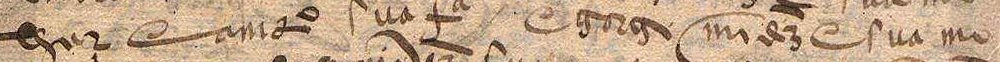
lher e amto sua fa / e gorge m̄edez e sua mo
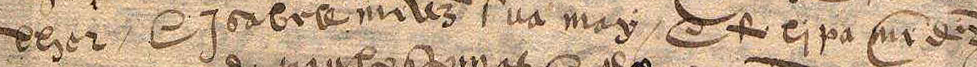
lher / e Jsabell mēdez sua may / e feljpa m̄edez
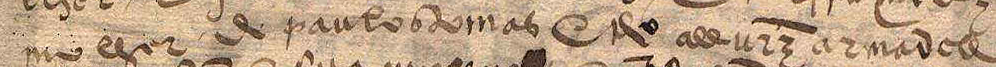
molher de paulos tomas e dio allur̄z armadell
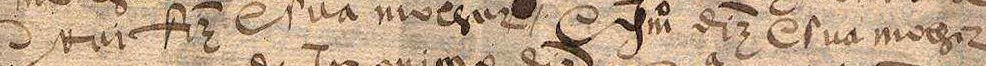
e Rui frz̄ e sua molher / e Jmo dīz e sua molher
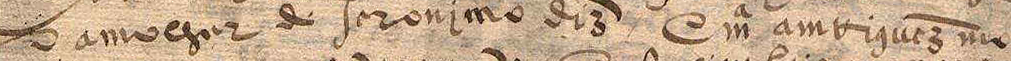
e a molher de Jeronjmo dīz / e ma amRiquez mo
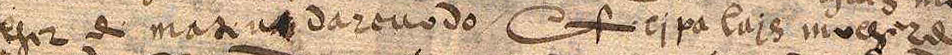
lher de mateu_ darcuodo / e feljpa lujs molher de
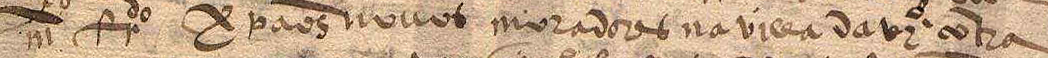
mte frdo/ Xpãos nouos moradores na villa davro. cōtra
